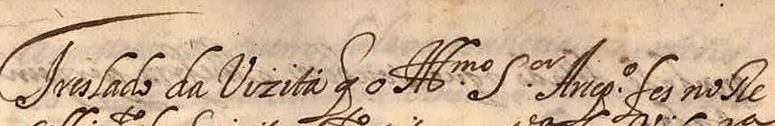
Treslado da Vizita q̄ o Ill.mo S.or Arcep.o fes no Re
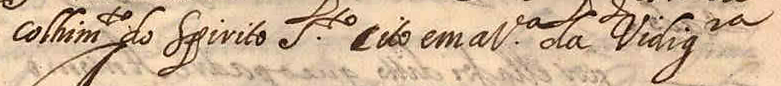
colhimto do Spirito S.to cito em a V.a da Vidig.ra
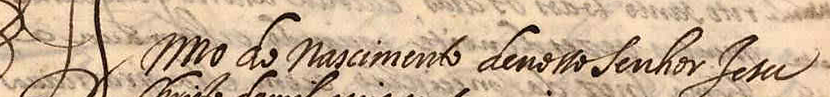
Anno do nascimento de nosso Senhor Jesu
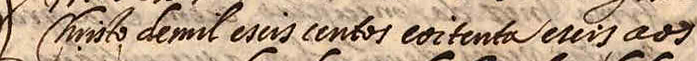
Christo de mil e seiscentos e oitenta e seis aos
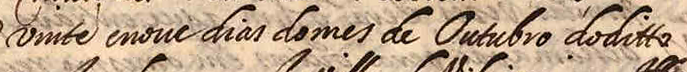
vinte e noue dias do mes de Outubro do ditto
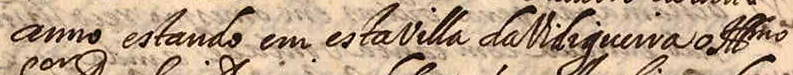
anno estando em esta villa da Vidigueira o Ill.mo
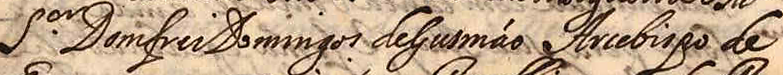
S.or Dom frei Domingos de Gusmão Arcebispo de
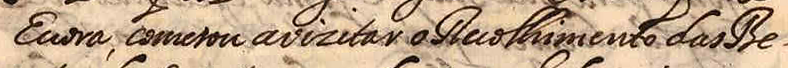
Euora, comesou a vizitar o Recolhimento das Be
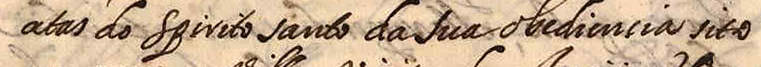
atas do Spirito santo da sua obediencia sito
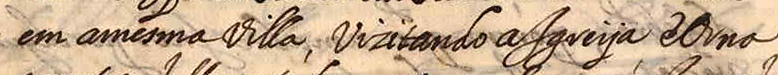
em a mesma villa, vizitando a Jgreija e Orna
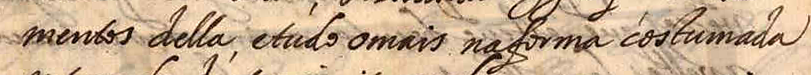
mentos della, e tudo o mais na forma costumada
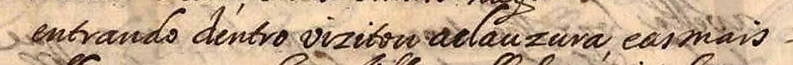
entrando dentro vizitou a clauzura, e as mais
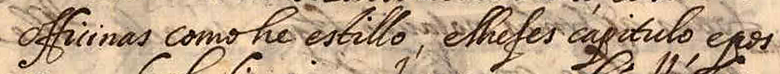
officinas como he estillo, e lhe fes capitulo, e pos
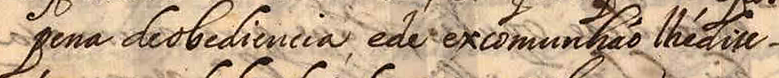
pena de obediencia, e de excomunhaõ lhe dise
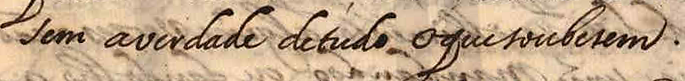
sem a verdade de tudo o que soubesem.
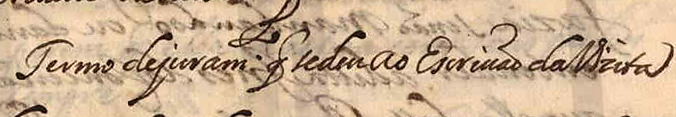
Termo de juram.to q̄ se deu ao Escriuaõ da Vizita
